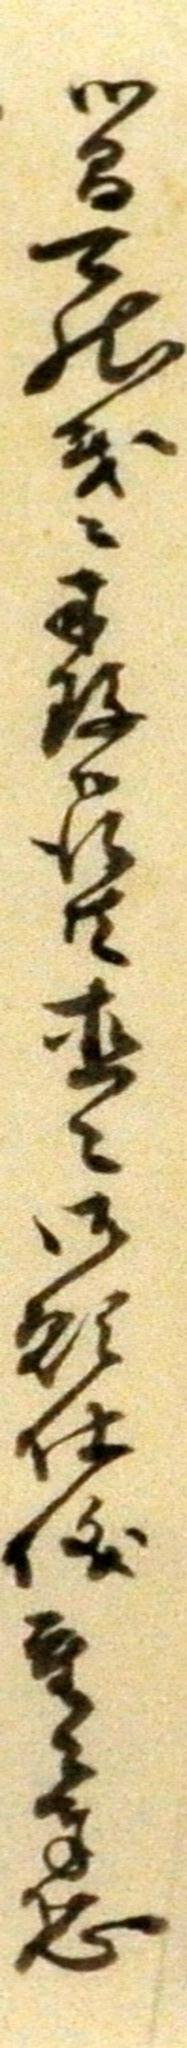候間可然義ニ奉存候得共直ニ御願仕儀更ニ奉恐
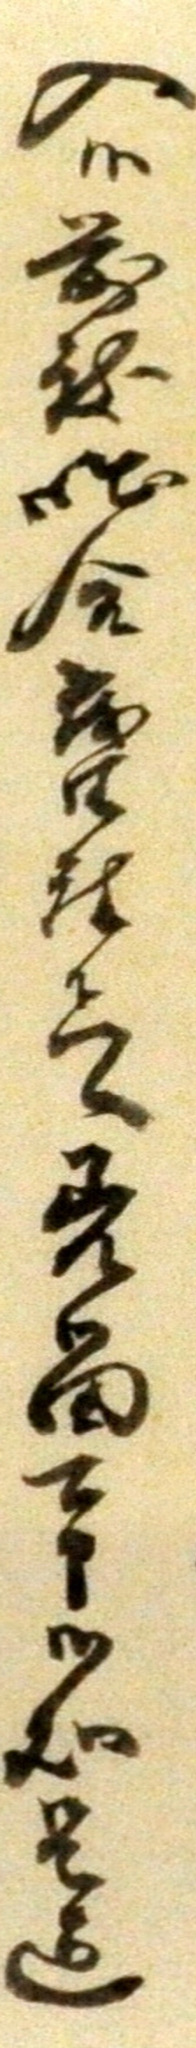入候前致咄合茂御座候ハハ差留可申候処是迄
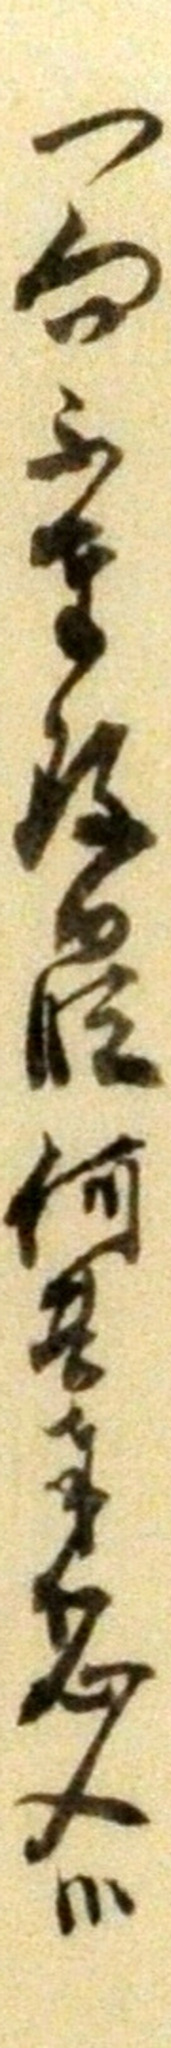不奉存候段何共奉恐入候
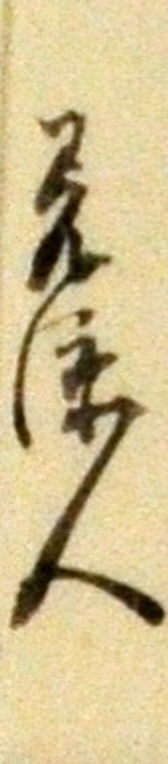差添人
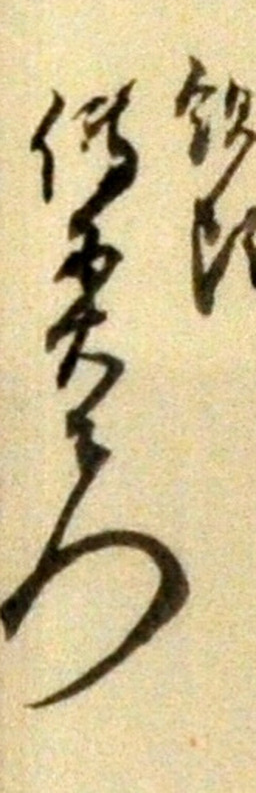傳五右エ門

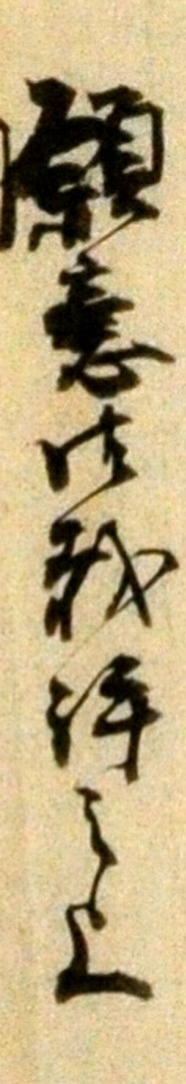願意御裁許之上
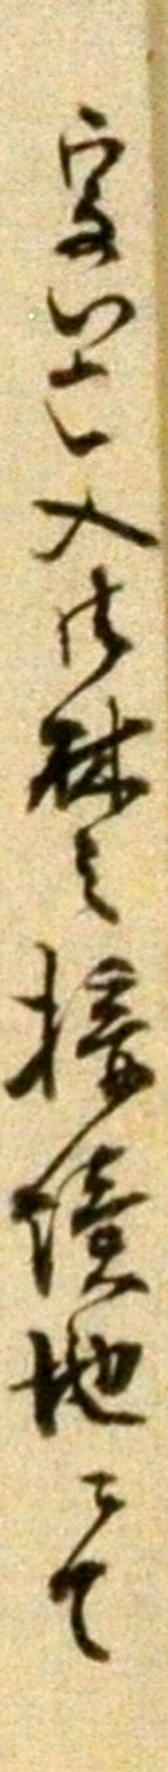字いこ入御林之接境地二て
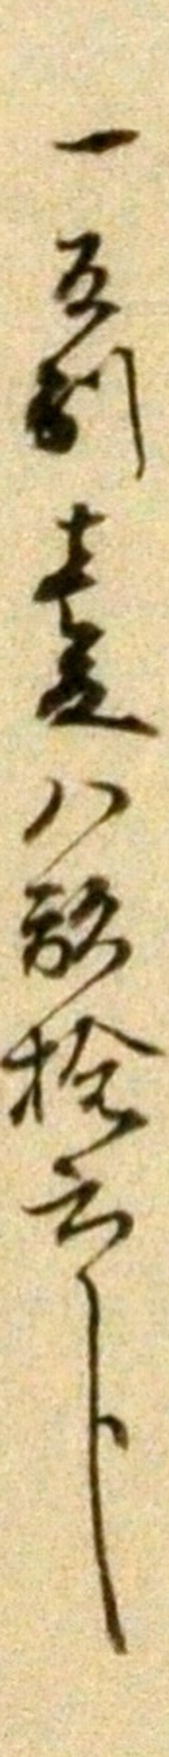一反別壱反八畝拾六ト
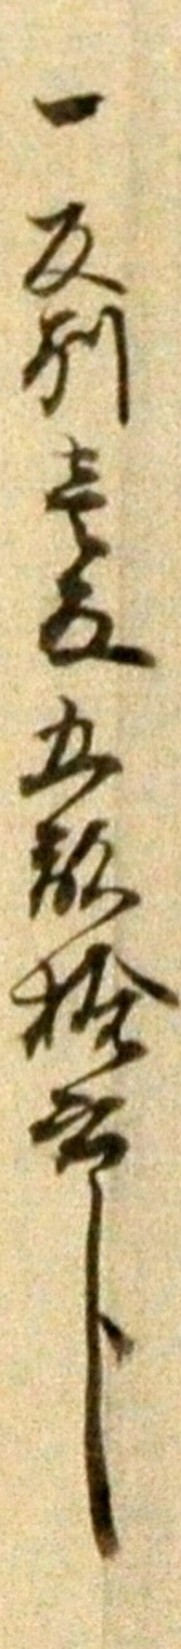一反別壱反五畝拾六ト
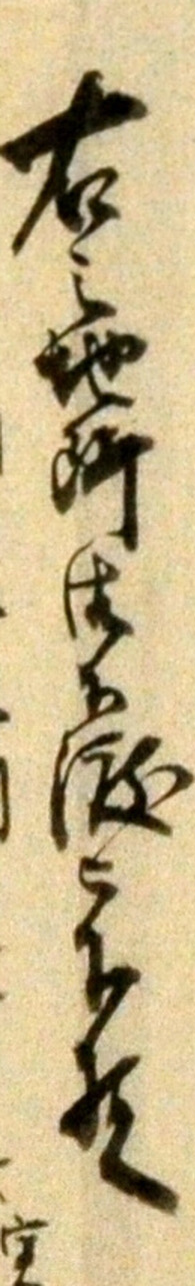右之地所御下渡二下候
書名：中沢村駕籠訴事件書類写
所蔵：伊那市立高遠町図書館・合同会社AMANE
